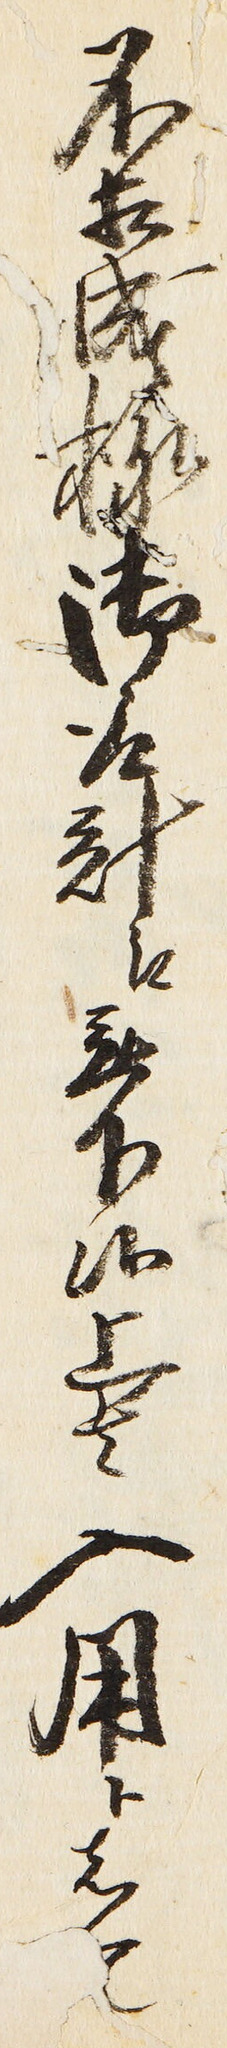不相成様御取計江被下候上者入用ト者
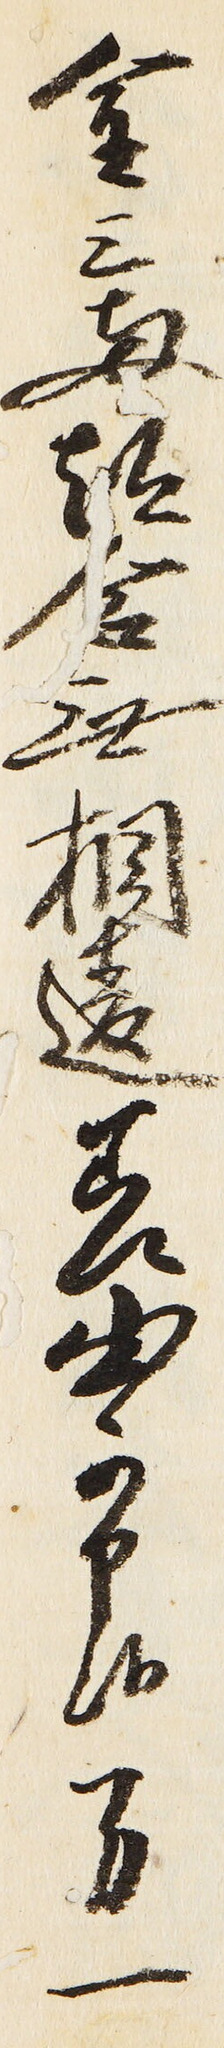金三両都合無相違差出可申候万一
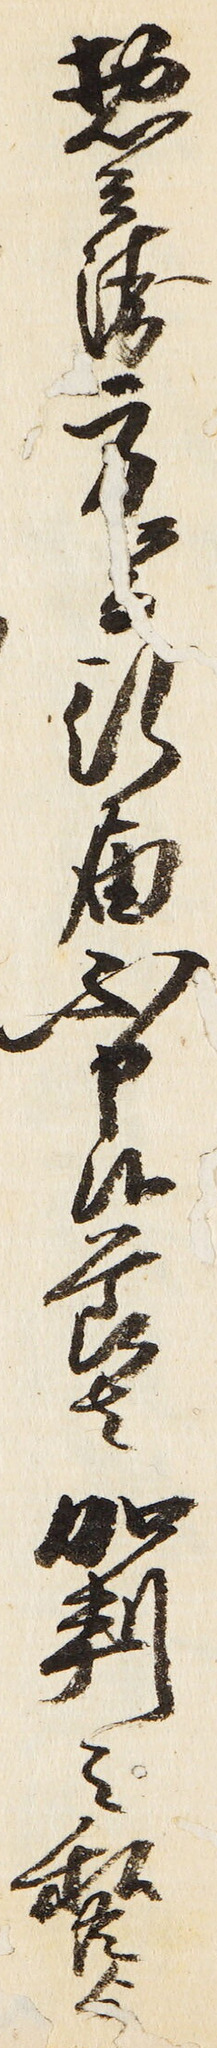惣兵衛方ニ而行届不申候節者加判之私共ゟ
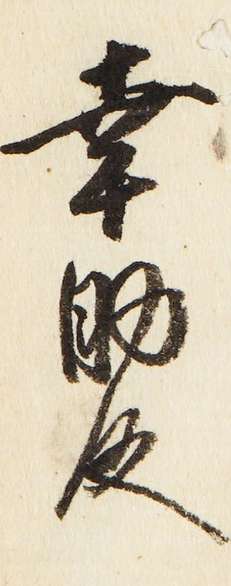幸助殿

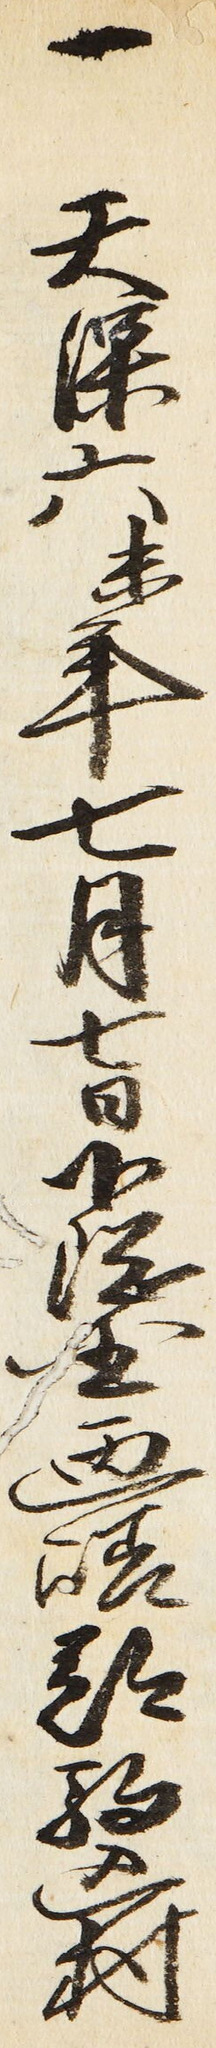一天保六未年七月七日下総国匝瑳郡駒込村
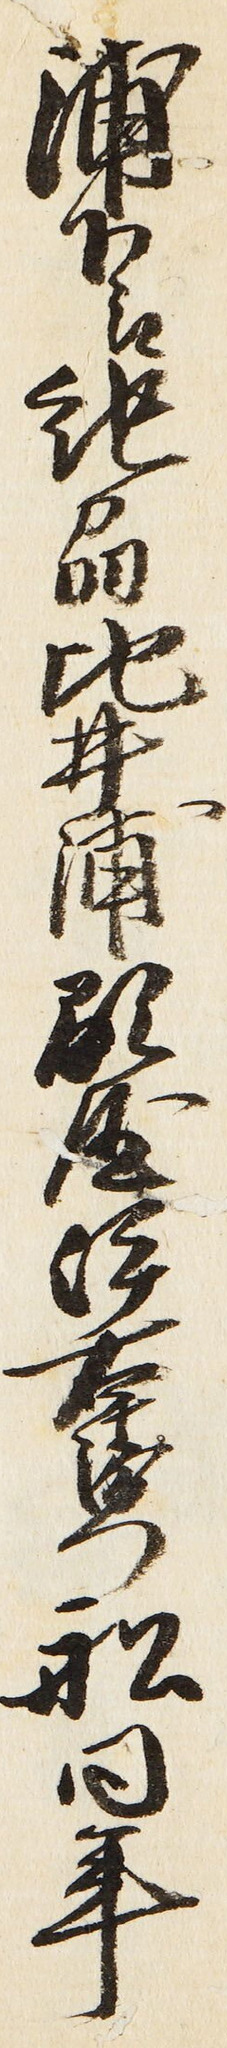浦下江紀州比井浦顕屋伊右衛門船同年
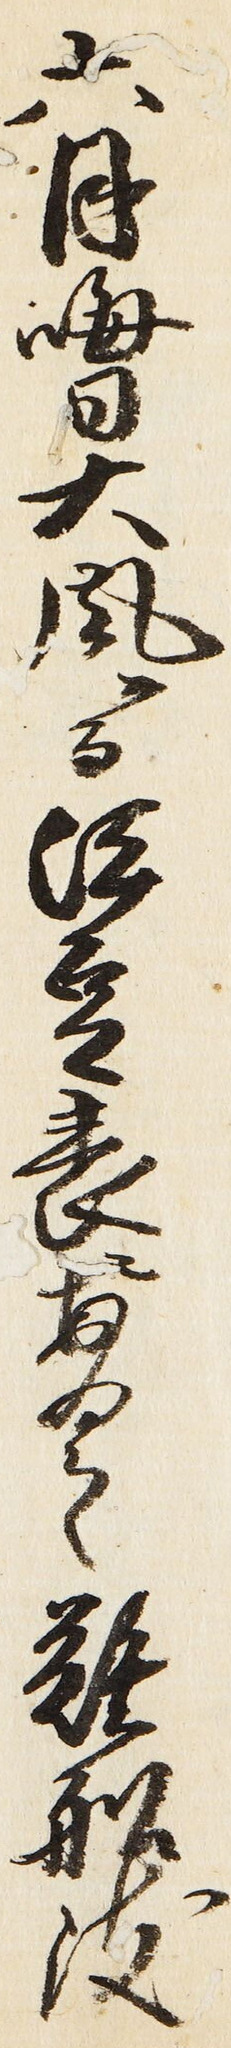六月晦日大風ニ而伊豆表ニおゐて難船致
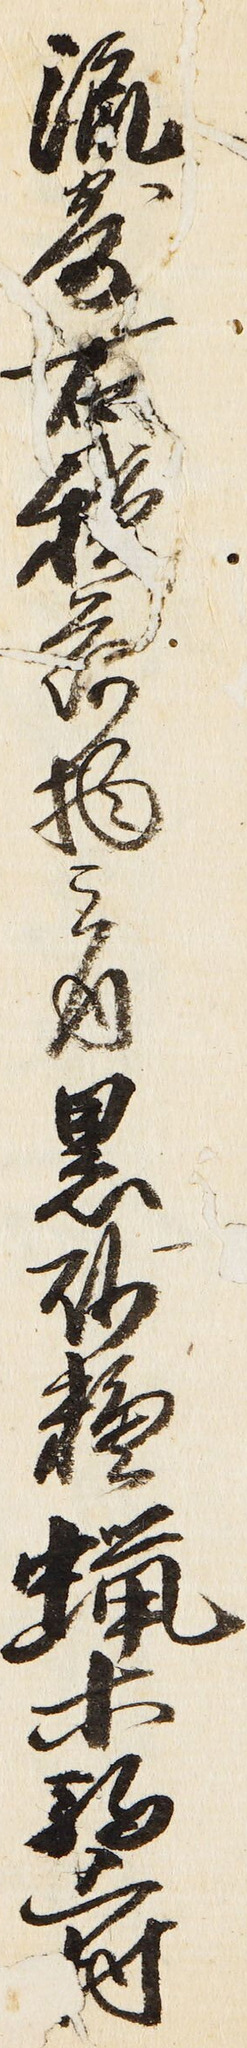流寄右積荷物之内黒砂糖蝋等駒込村
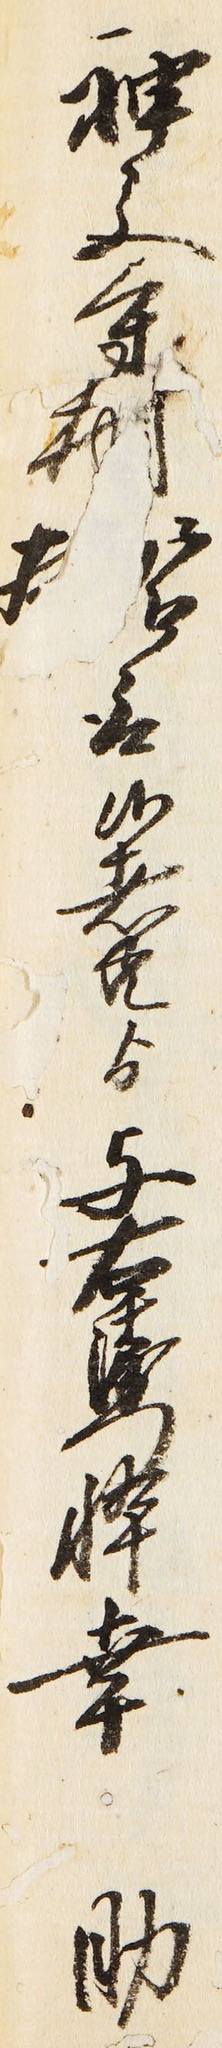神宮寺村取候者共ゟ与右衛門忰幸助
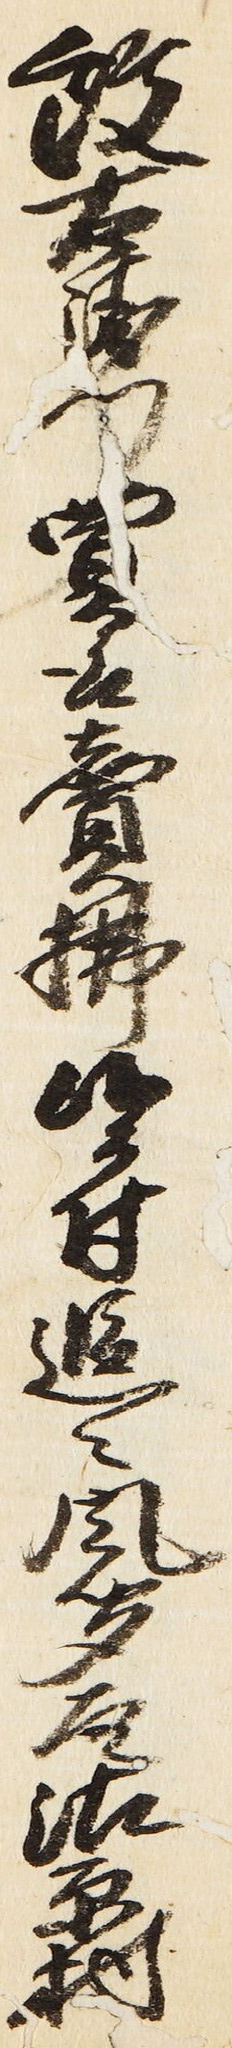政右衛門買取売払候ニ付追々風聞故佐原村
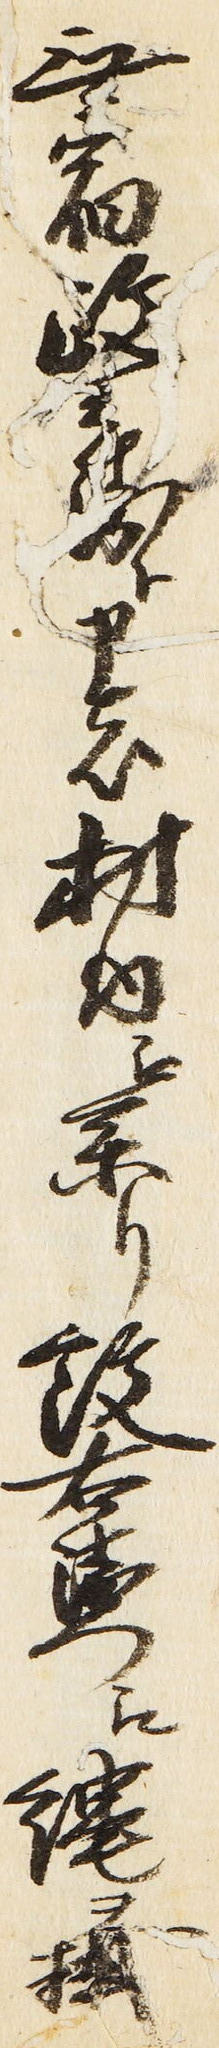無宿政兵衛ト申者村内江参り政右衛門江縄ヲ掛
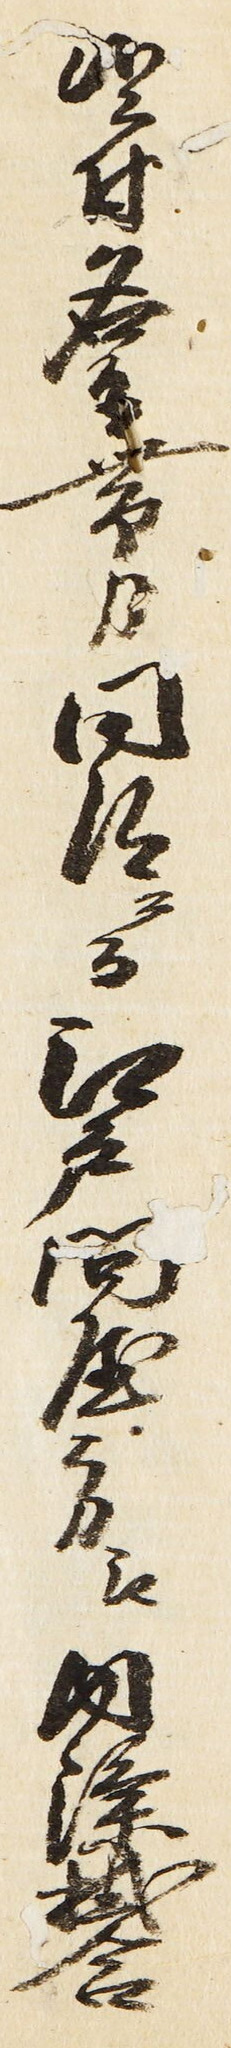候ニ付名主帯刀同道ニ而江戸問屋方江内済掛合
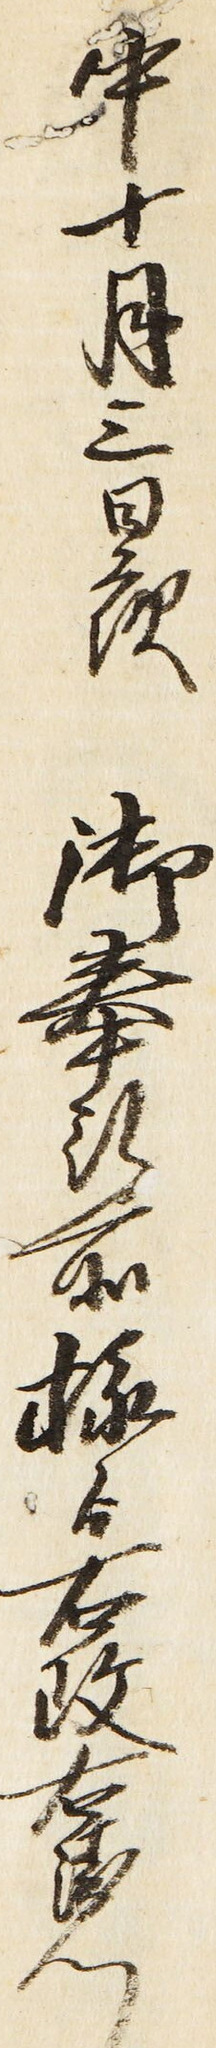中十月三日夜御奉行所様ゟ右政右衛門
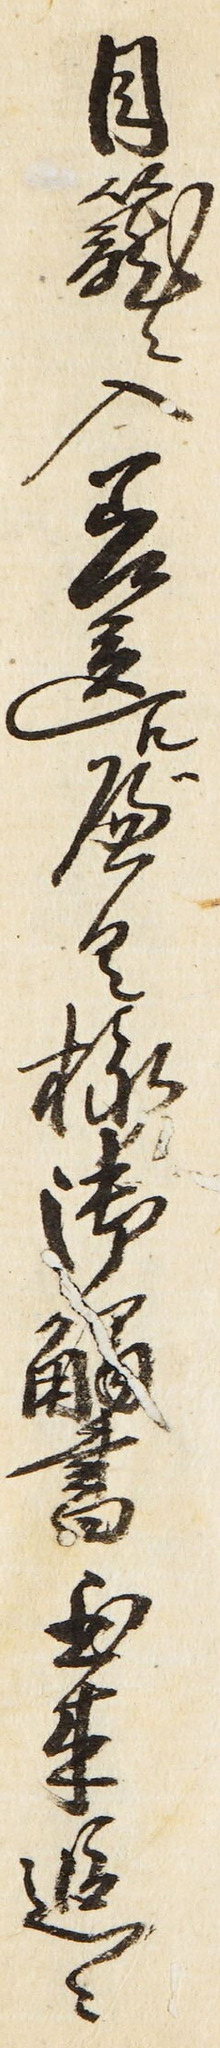目籠ニ入差送ルべく様御触書到来追々
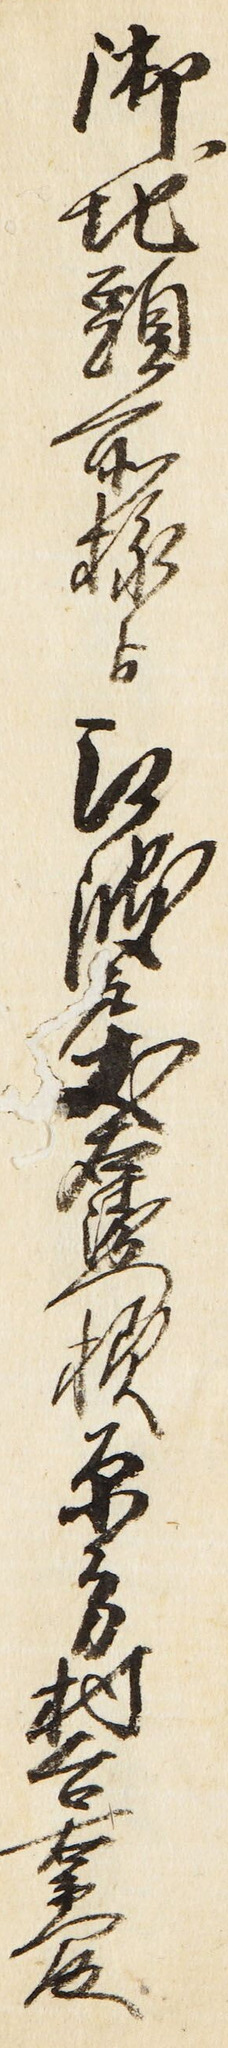御地頭所様ゟ江波戸丈右衛門様原方村台右衛門殿
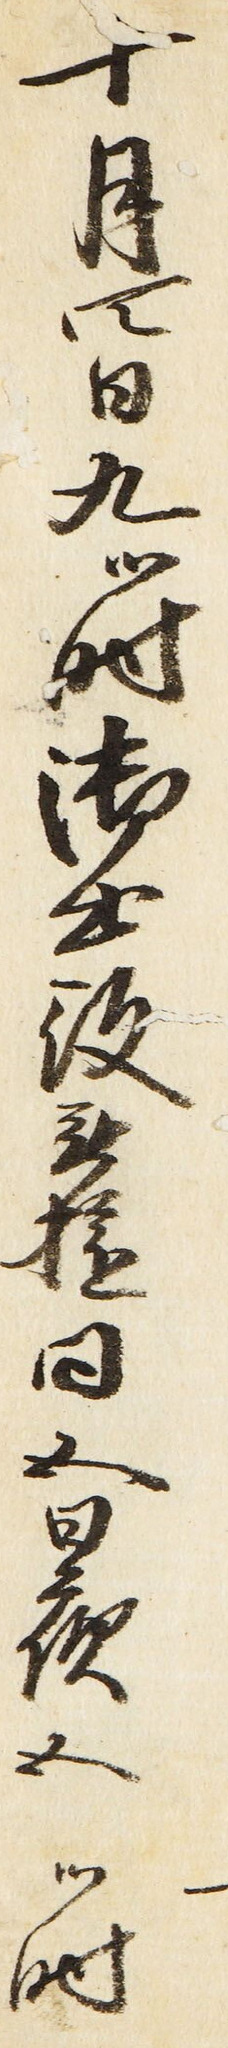十月四日九ツ時御出役被遊同五日夜五ツ時
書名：難船一件記録
